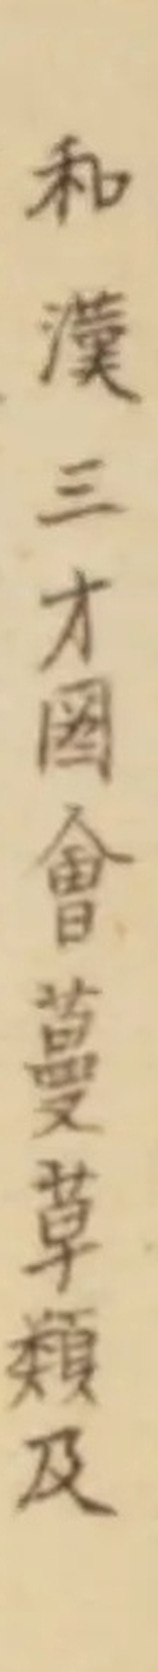和漢三才図会蔓草類及
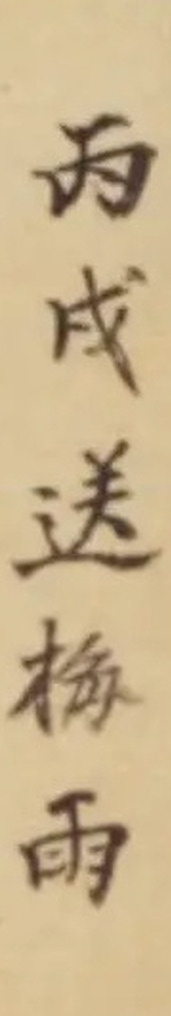丙戌送梅雨
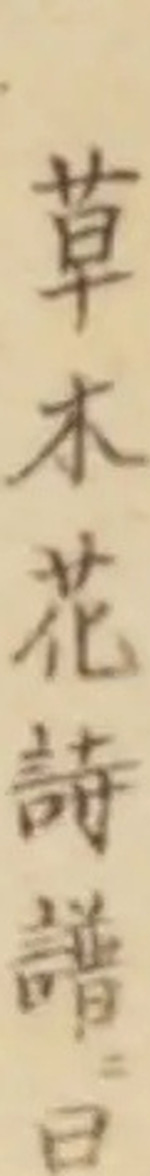草木詩譜ニ曰
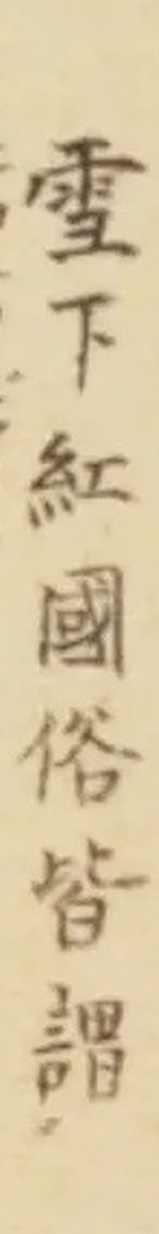雪下紅国俗皆謂
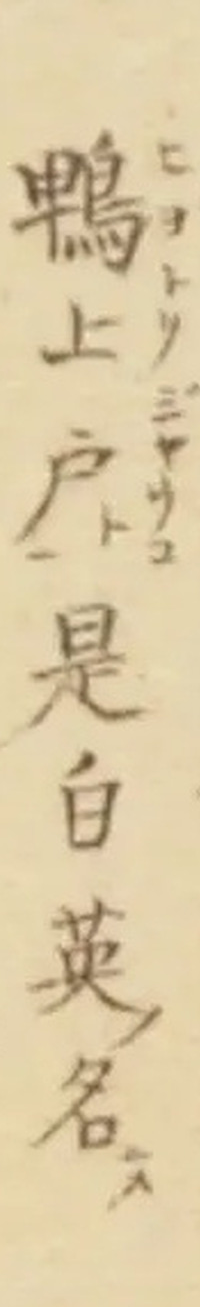鴨上戸是白英ノ名ニス
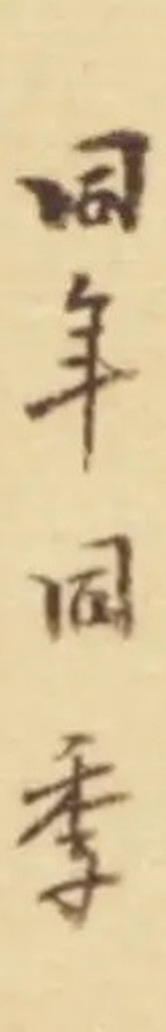同年同季
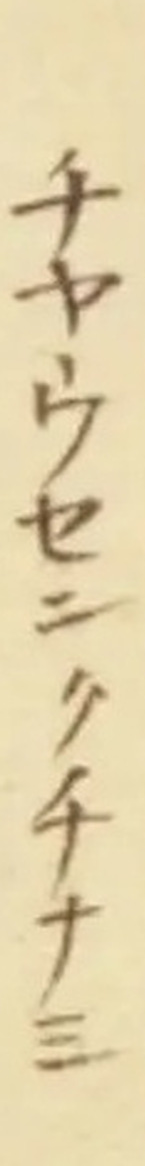チヤウセンクチナシ
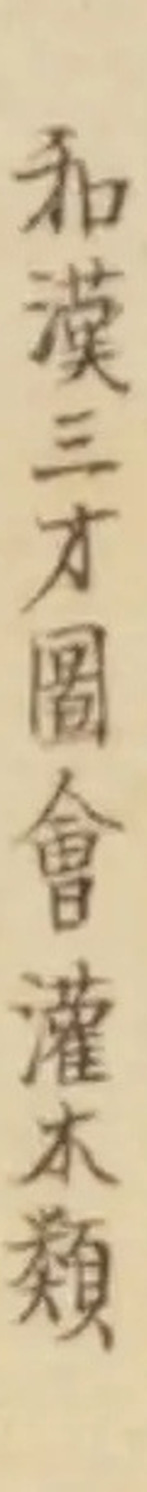和漢三才図会灌木類

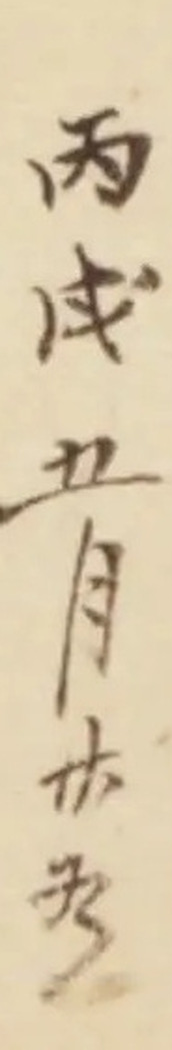丙戌五月廿有
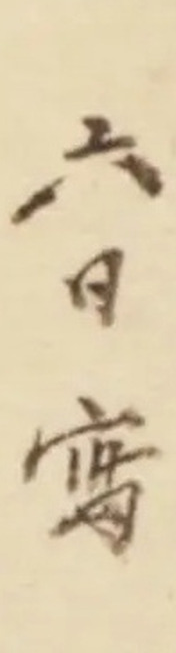六日写
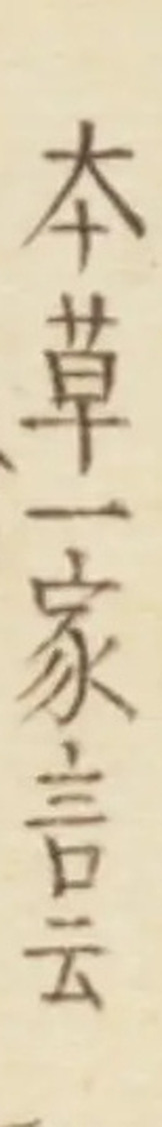本草一家言云
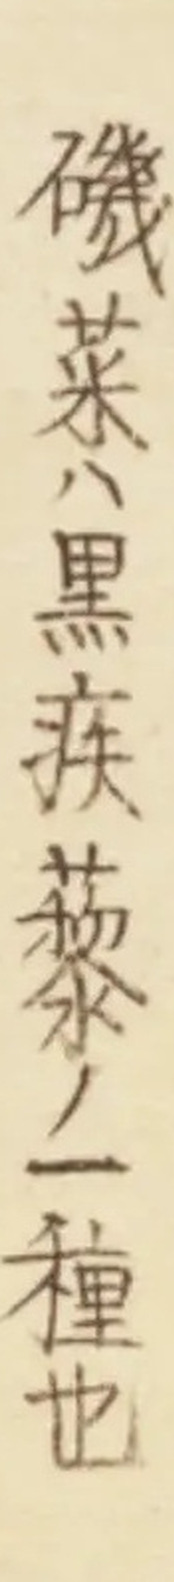磯菜ハ黒疾藜ノ一種也
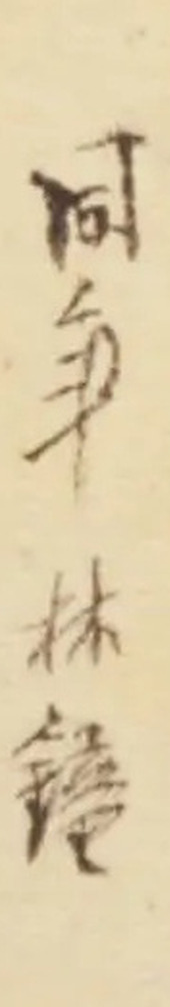同年林鐘
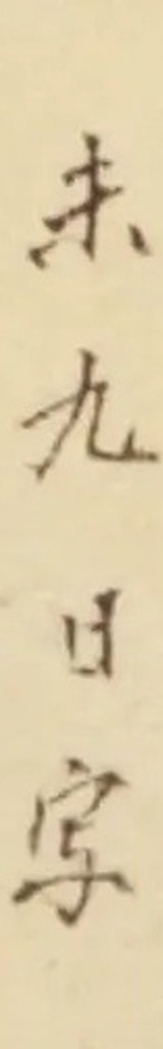未九日写
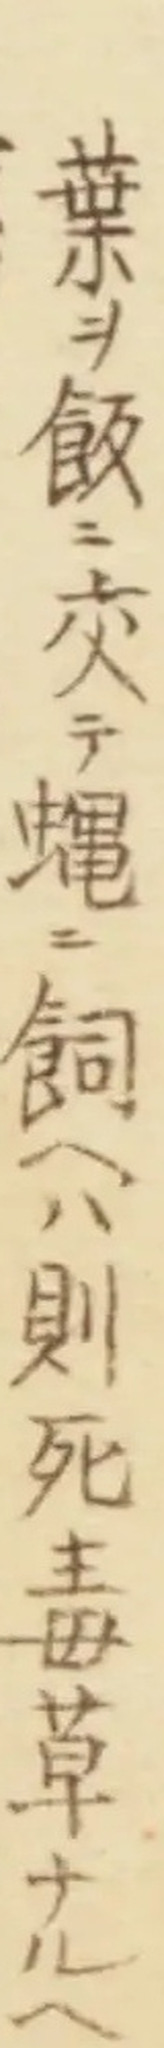葉ヲ飯ニ交テ蝿ニ飼ヘハ則死毒ナルヘシ
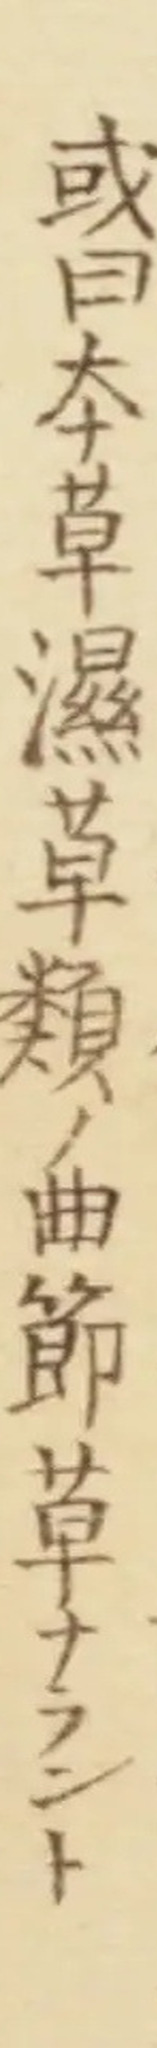或曰本草湿草類ノ曲節草ナラント
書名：梅園草木花譜夏之部. 4
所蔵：国立国会図書館 National Diet Library, JAPAN
